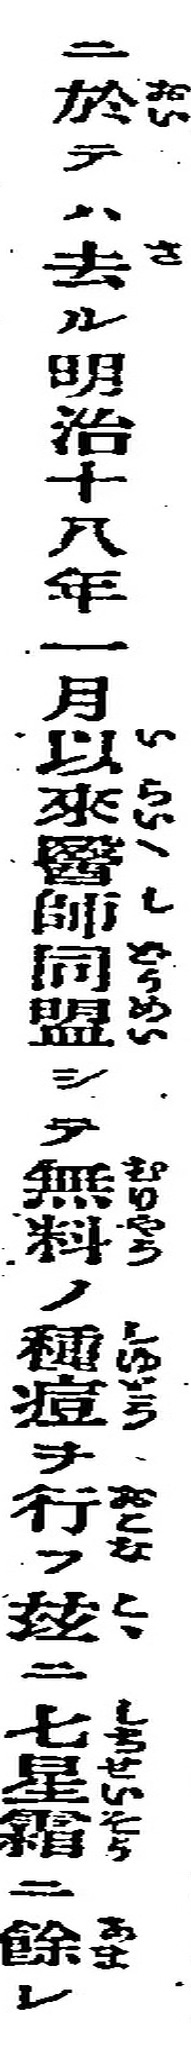ニ於テハ去ル明治十八年一月以來医師同盟シテ無料ノ種痘ヲ行フ茲ニ七星霜ニ余レ

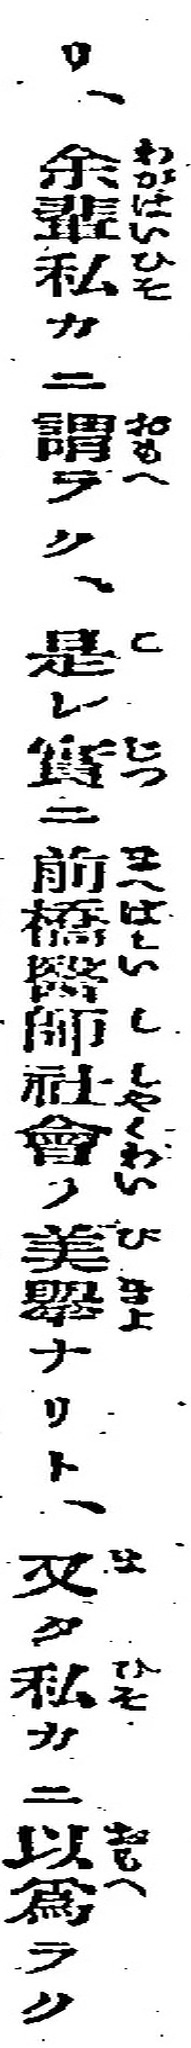リ、余輩私カニ謂ラク、是レ実ニ前橋医師社会ノ美挙ナリト、又タ私カニ以為ラク
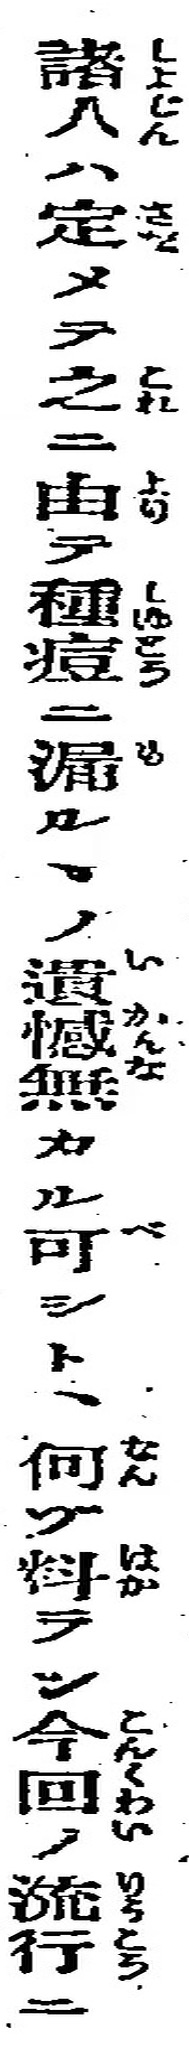諸人ハ定メテ之ニ由テ種痘ニ漏ルヽノ遺憾無カル可シト、何ゾ料ラン今回ノ流行ニ
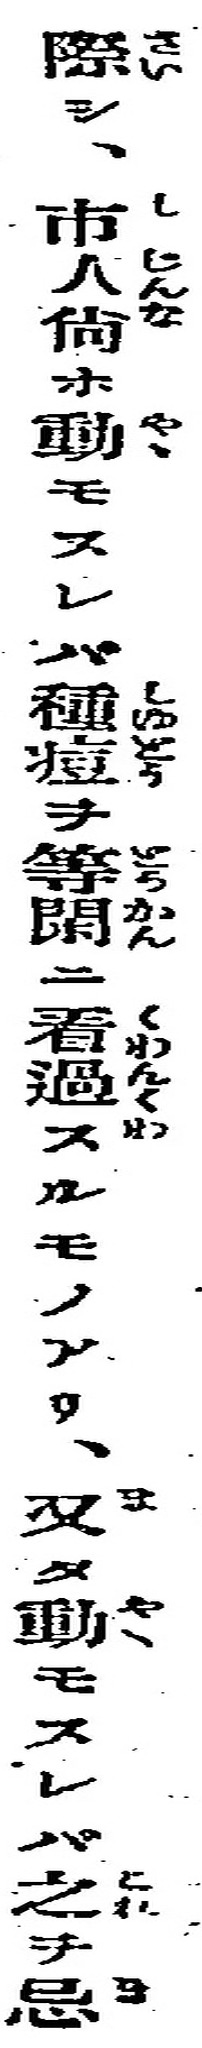際シ、市人尚ホ動モスレバ種痘ヲ等閑ニ看過スルモノアリ、又タ動モスレバ之ヲ忌
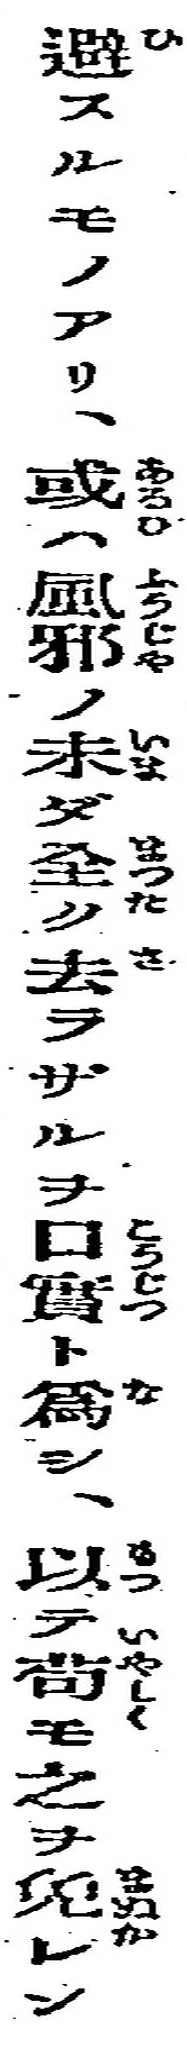避スルモノアリ、或ハ風邪ノ未ダ全ク去ラザルヲ口実ト為シ、以テ苟モ之ヲ免レン
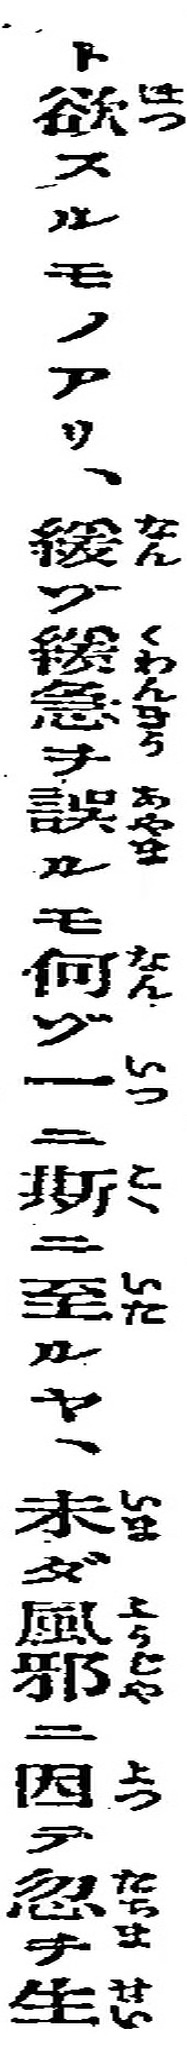ト欲スルモノアリ、緩ゾ緩急ヲ誤ルモ何ゾ一ニ斯ニ至ルヤ、未ダ風邪ニ因テ忽チ生
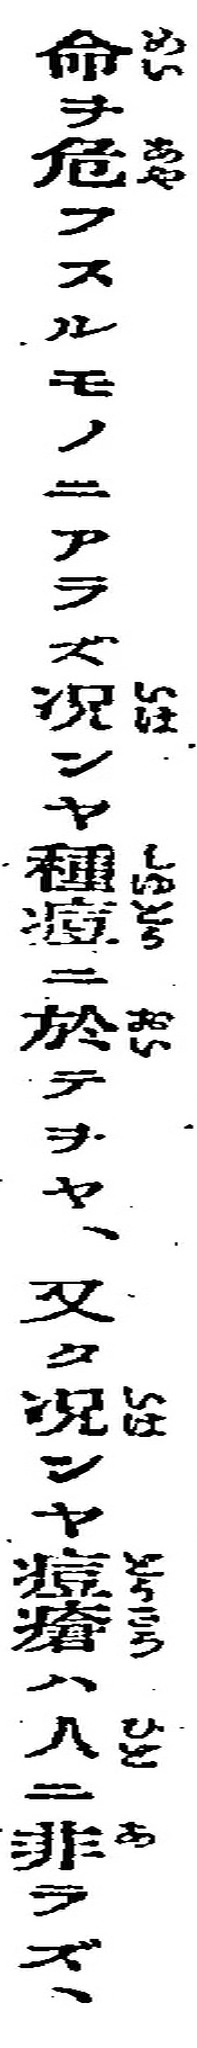命ヲ危フスルモノニアラズ況ンヤ種痘ニ於テヲヤ、又タ況ンヤ痘瘡ハ人ニ非ラズ、
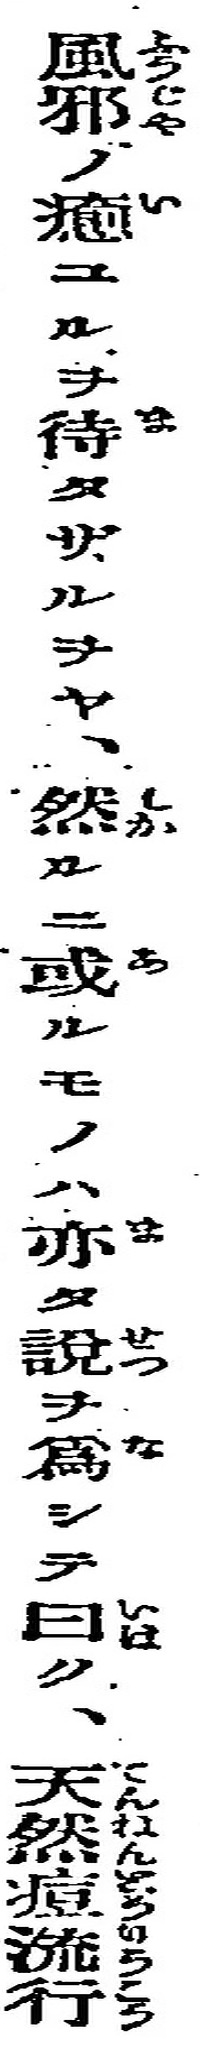風邪ノ癒ユルヲ待タザルヲ、然ルニ或ルモノハ亦タ説ヲ為シテ曰ク、天然痘流行
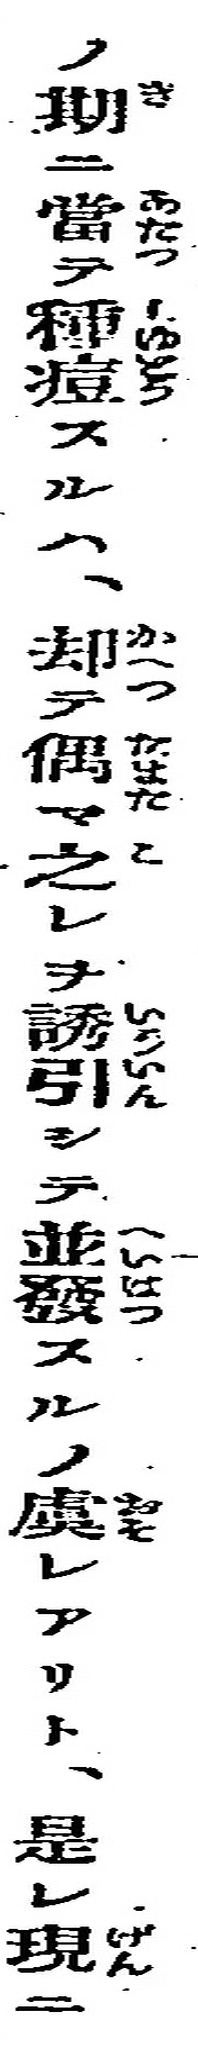ノ期ニ当テ種痘スルハ、却テ偶マ之レヲ誘引シテ並発スルノ虞レアリト、是レ現ニ
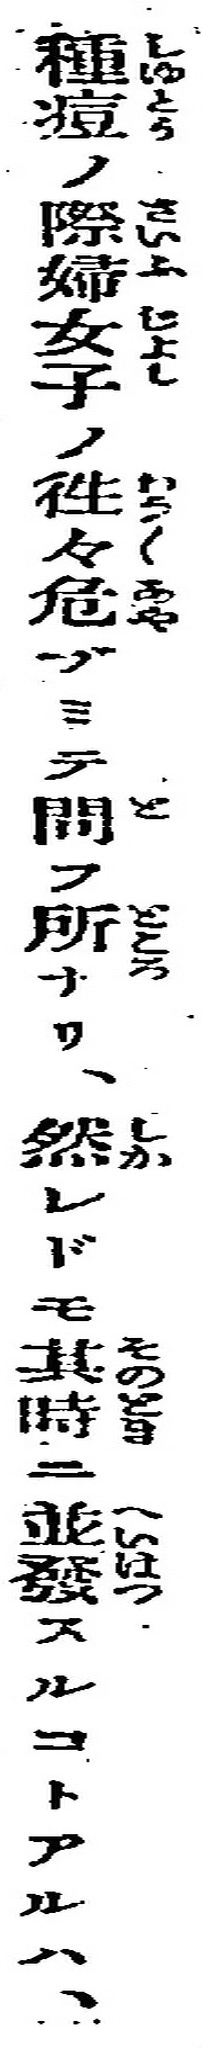種痘ノ際婦女子ノ往々危ブミテ問フ所ナリ、然レドモ其時ニ並発スルコトアルハ、
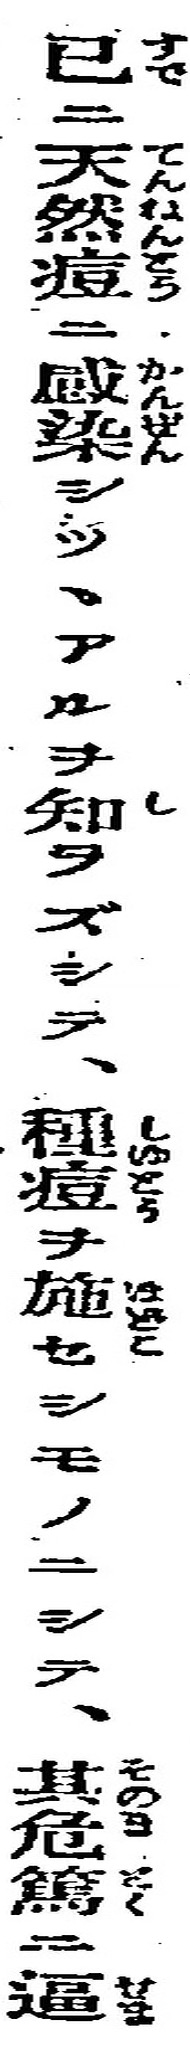已ニ天然痘ニ感染シツヽアルヲ知ラズシテ、種痘ヲ施セシモノニシテ、其危篤ニ逼
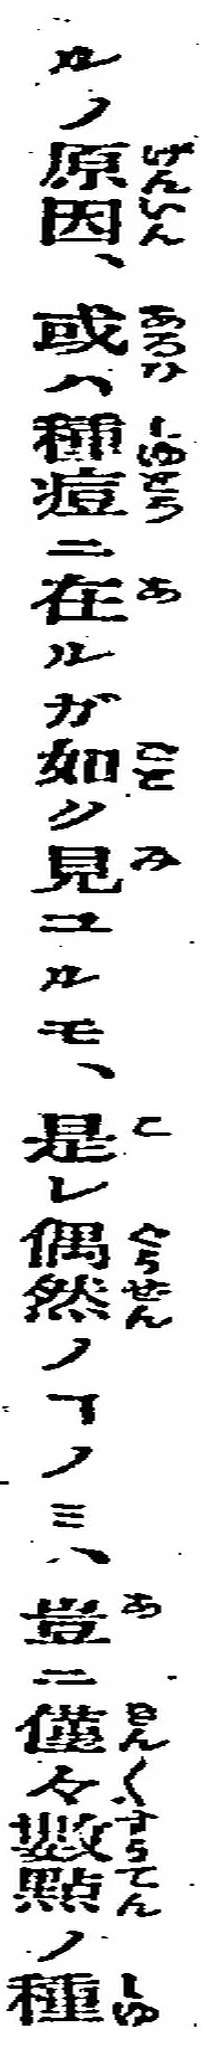ルノ原因、或ハ種痘ニ在ルガ如ク見ユルモ、是レ偶然ノヿノミ、豈ニ僅数点ノ種
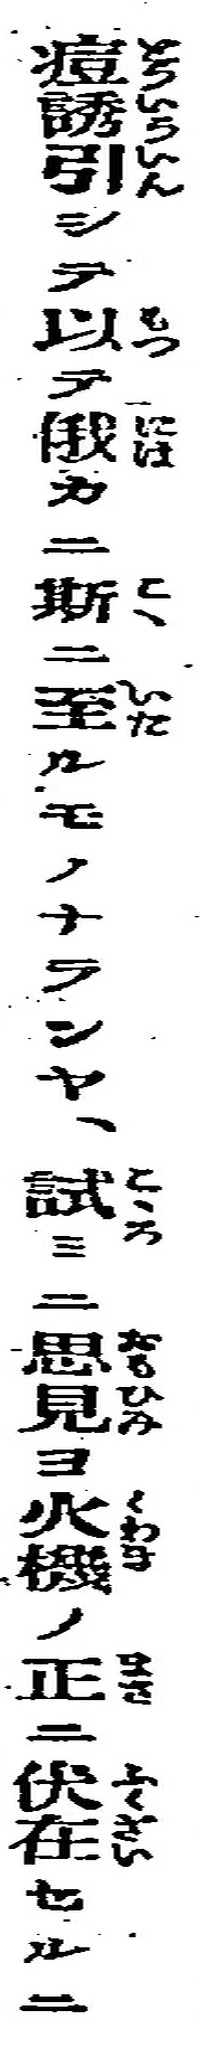痘誘引シテ以テ俄カニ斯ニ至ルモノナランヤ、試ミニ思見ヨ火機ノ正ニ伏在セルニ
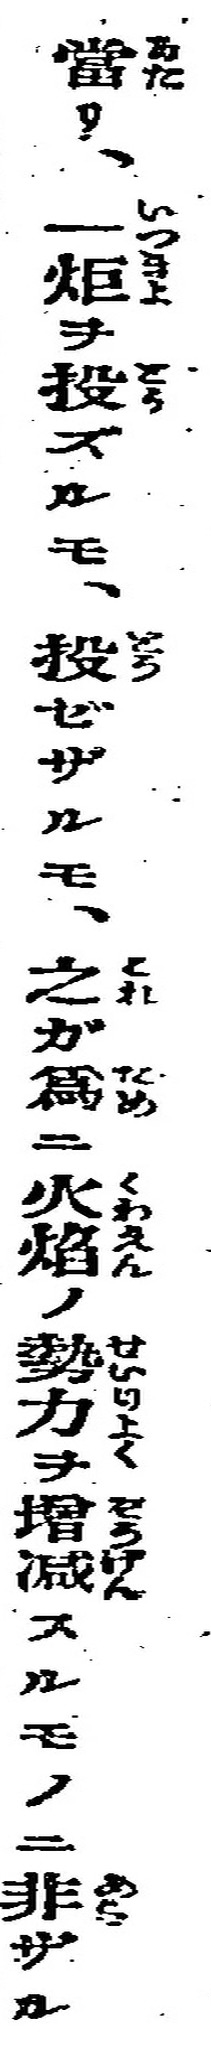当リ、一炬ヲ投ズルモ、投ゼザルモ、之ガ為ニ火焔ノ勢力ヲ増減スルモノニ非ザル
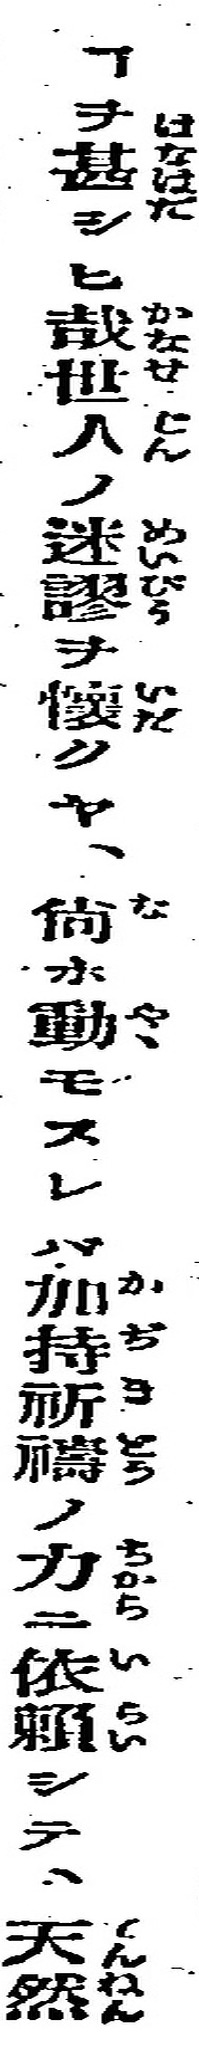ヿヲ甚シヒ哉世人ノ迷謬ヲ懐クヤ、尚ホ動モスレバ加持祈祷ノ力ニ依賴シテ、天然
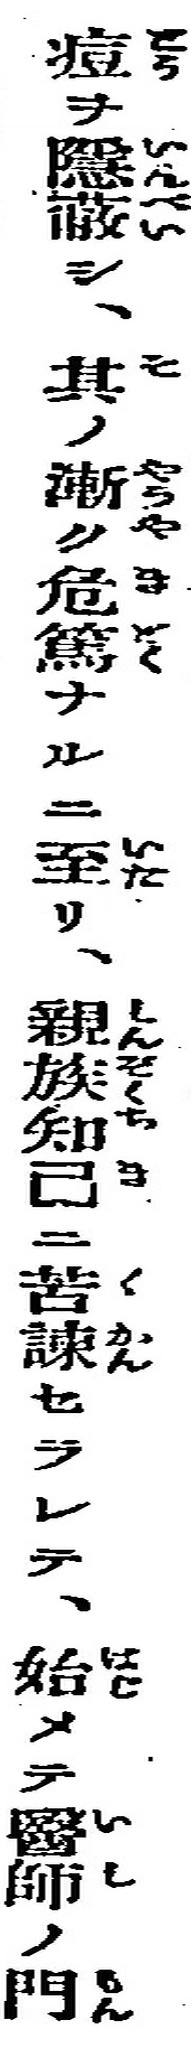痘ヲ隠蔽シ、其ノ漸ク危篤ナルニ至リ、親族知己ニ苦諫セラレテ、始メテ医師ノ門
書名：天然痘予防注意兼種痘者之注意
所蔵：国立国会図書館 National Diet Library, JAPAN
